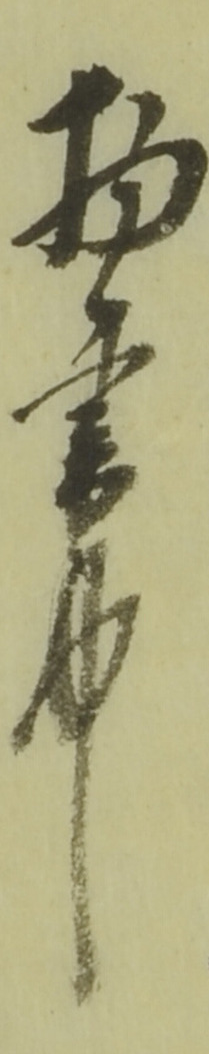物書中
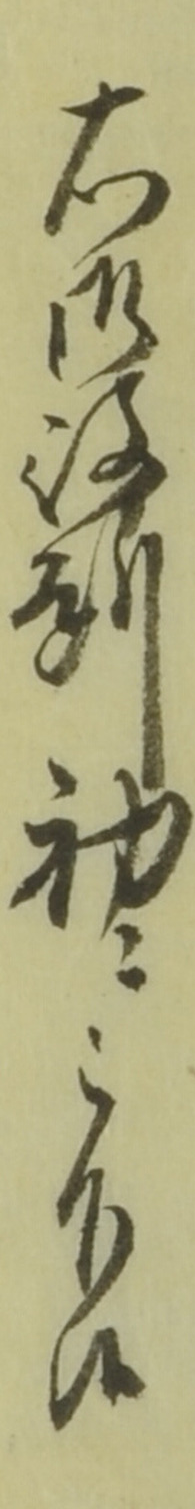右御役所初ニ被下候

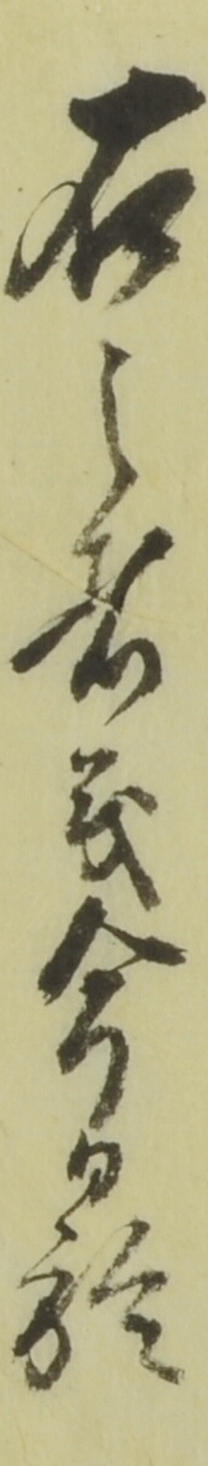右之者も今日於
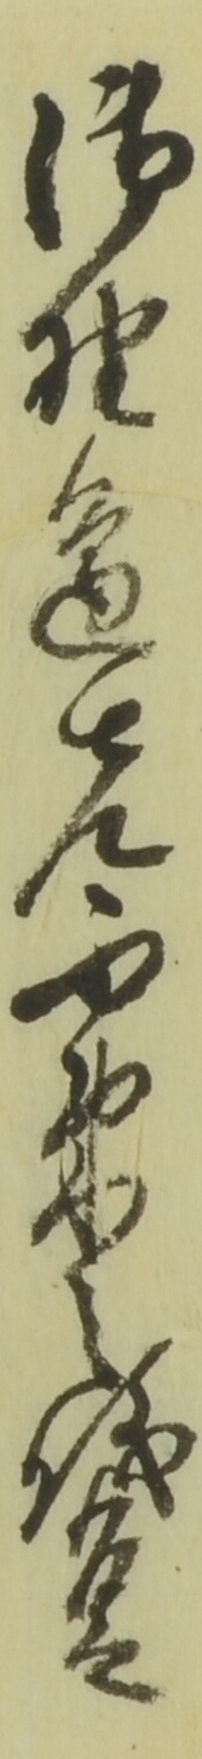御野辺先不束之儀有之
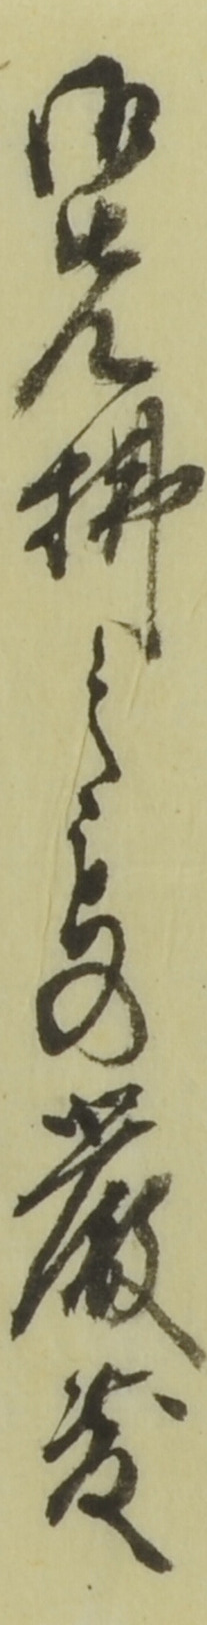御先払之もの厳敷
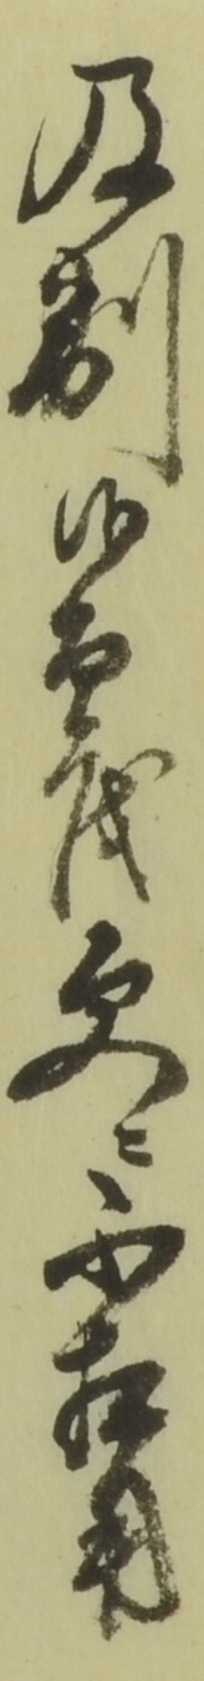及割候而も更ニ不相用
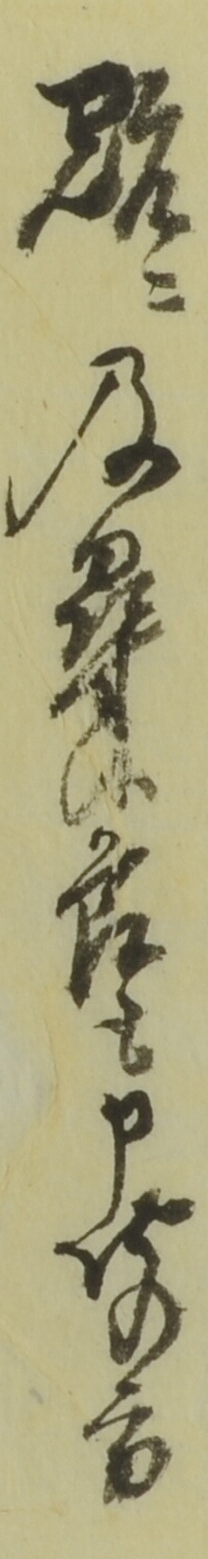既ニ及尋候節も申聞方
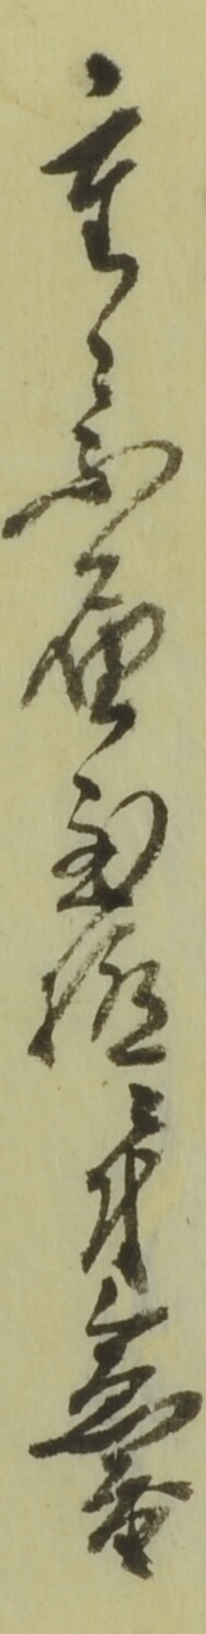重々不届至極ニ付急度
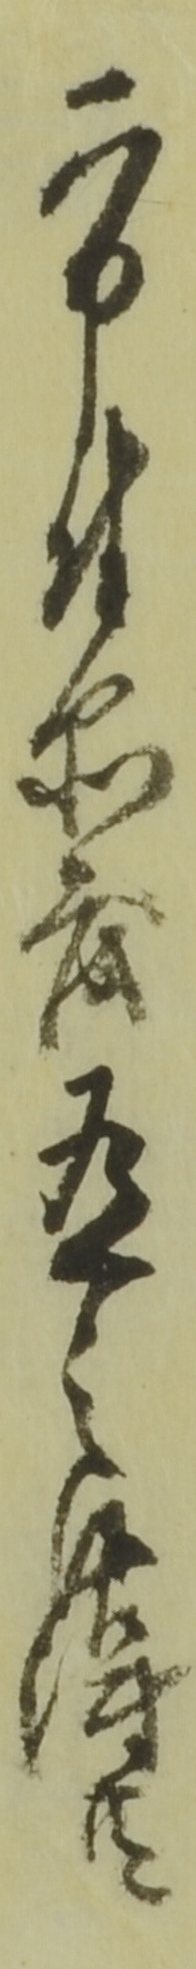可申付品も有之候得共
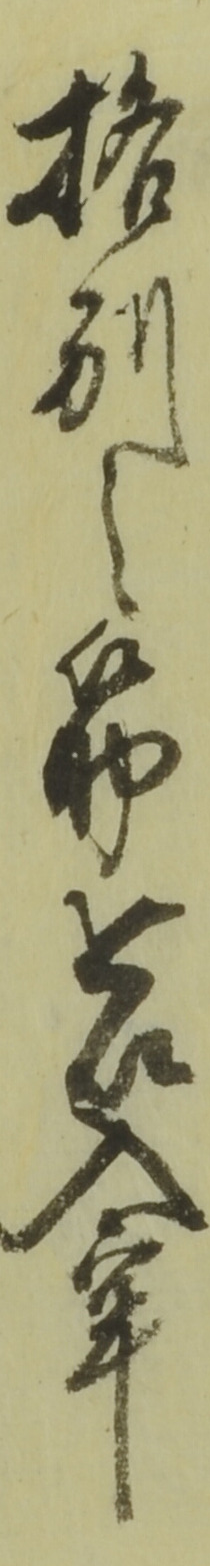格別之筋を以入窂
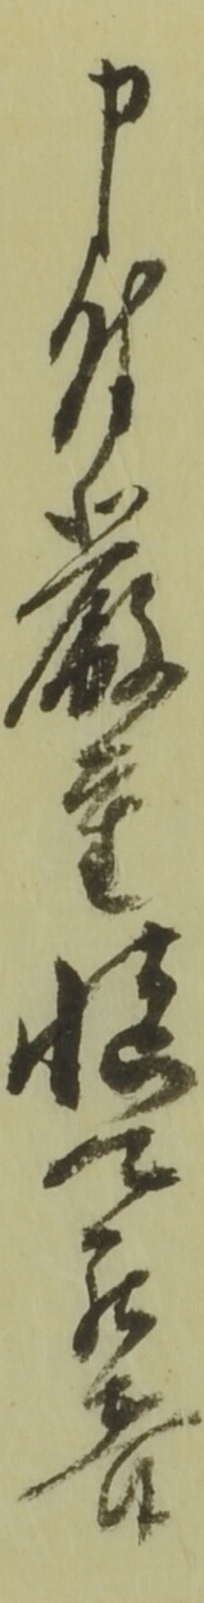申付厳重慎可罷在候
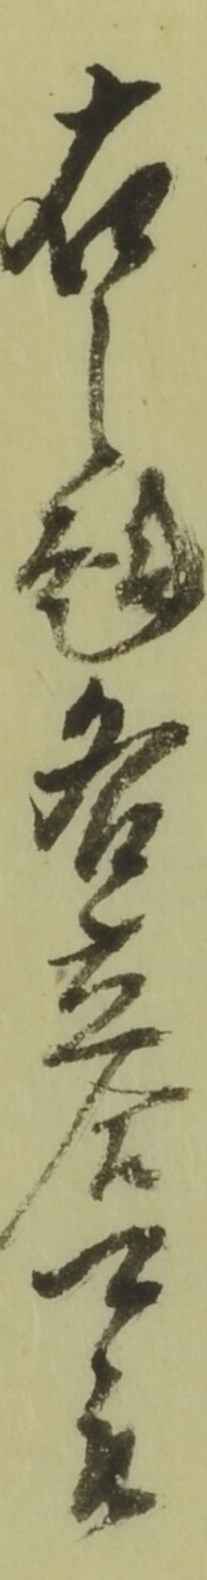右之趣各立合可被
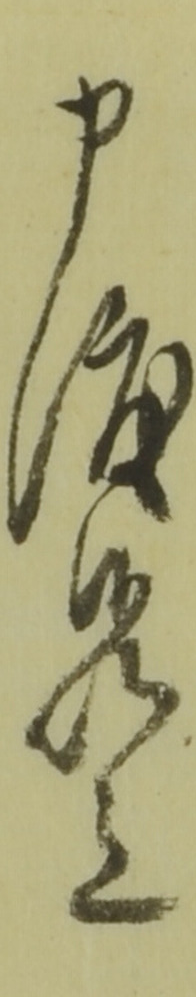申渡候以上
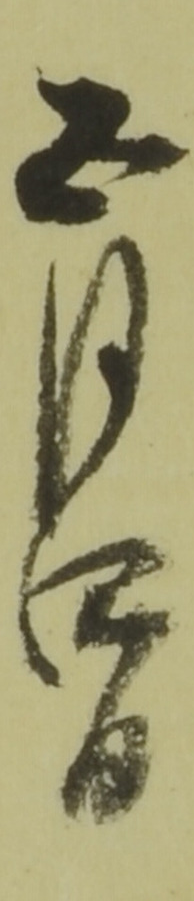五月四日
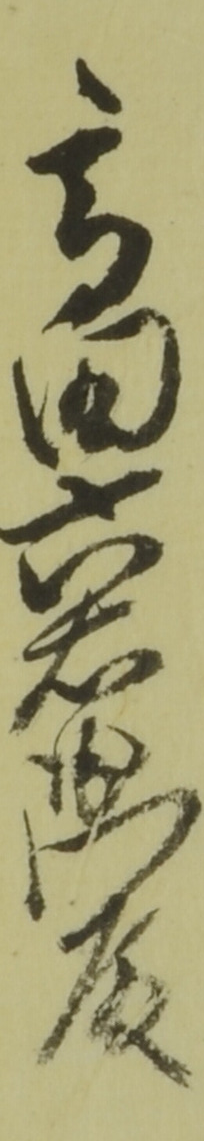高田六右衛門殿
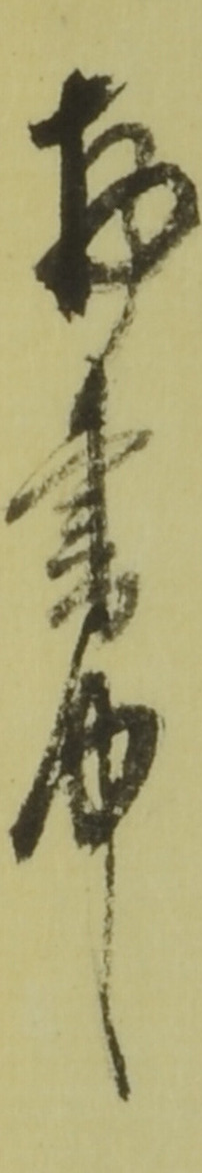物書中
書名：御触書御書附控
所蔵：伊那市立高遠町図書館・合同会社AMANE
